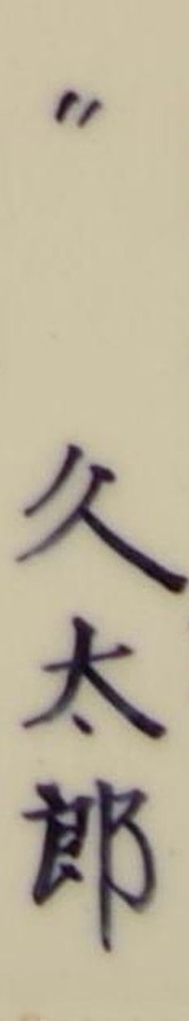久太郎
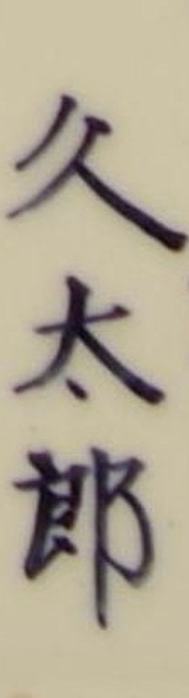久太郎
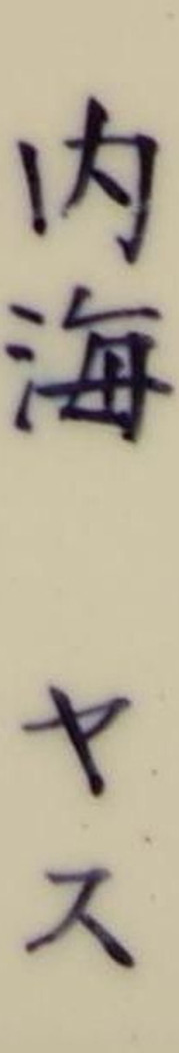内海ヤス
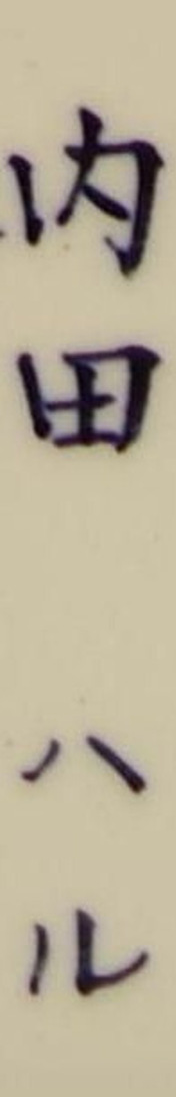内田ハル
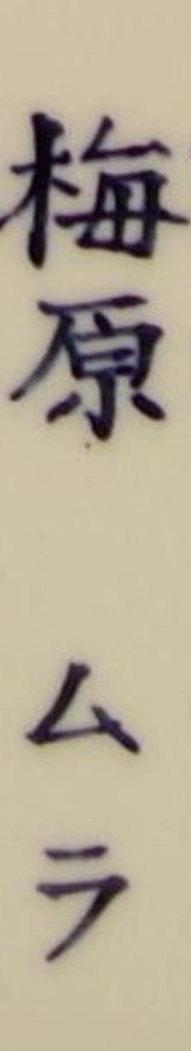梅原ムラ
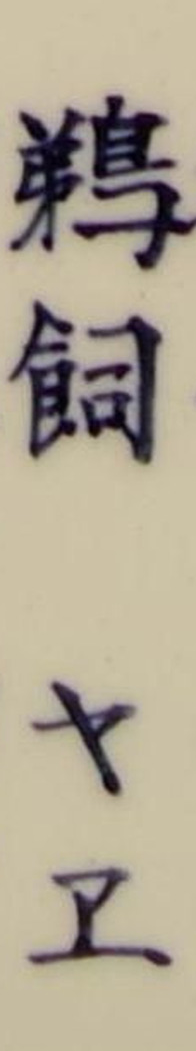鵜飼ヤエ
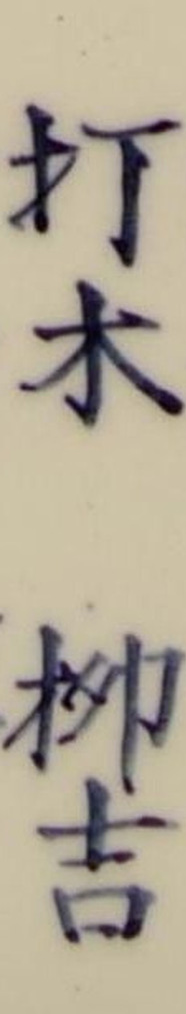朽木柳吉
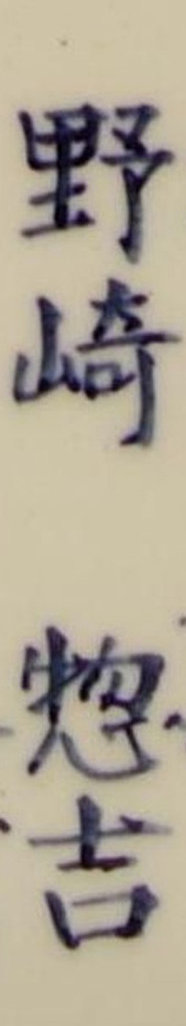野崎惣吉
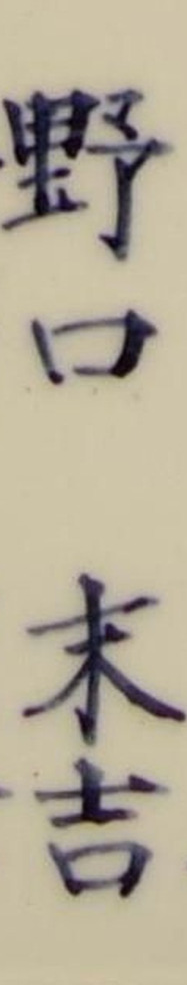野口末吉
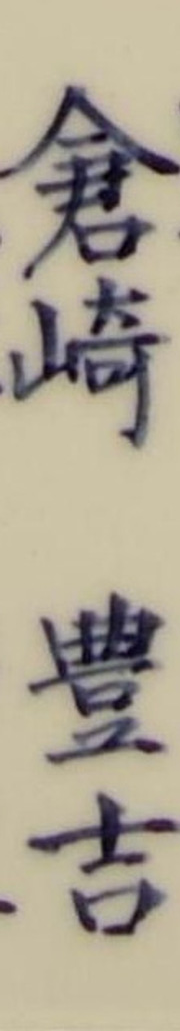倉崎豊吉
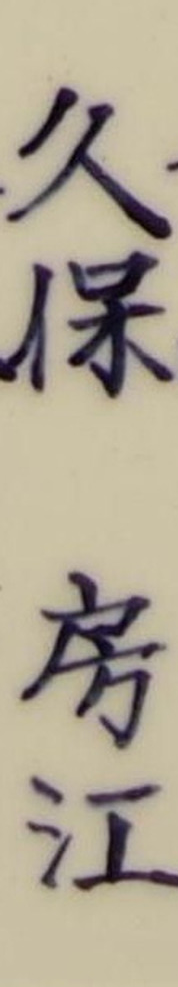久保房江
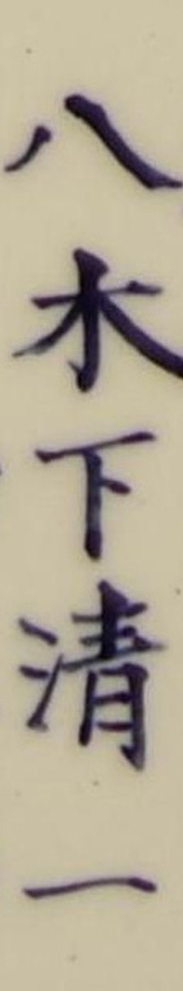八木下清一
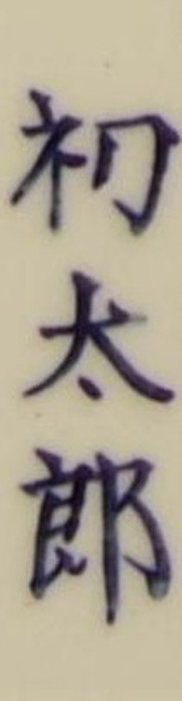初太郎
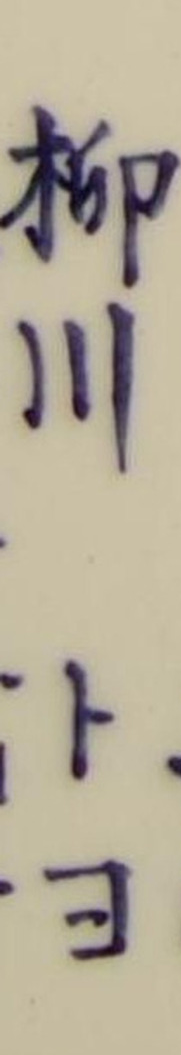柳川トヨ
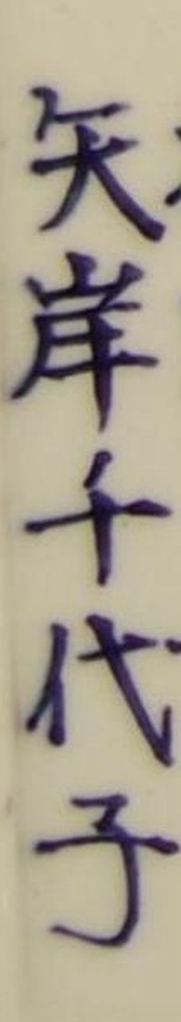矢岸千代子

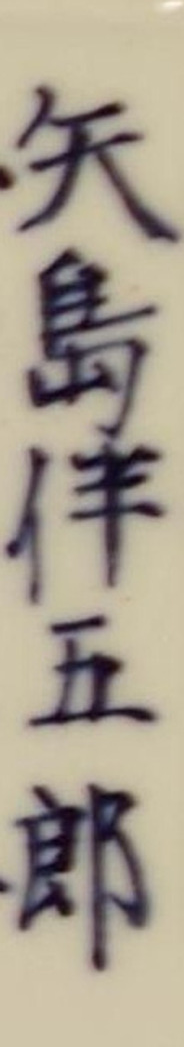矢島伴五郎
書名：E~L
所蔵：高野山金剛峯寺
